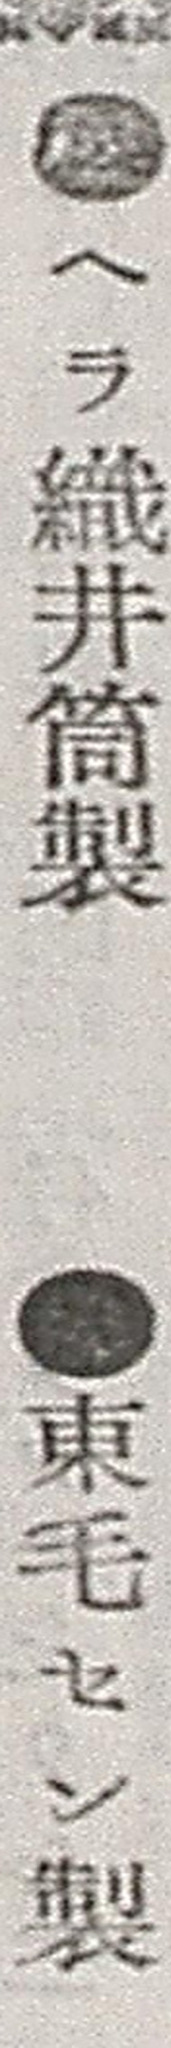●ヘラ織井筒製●東毛セン製
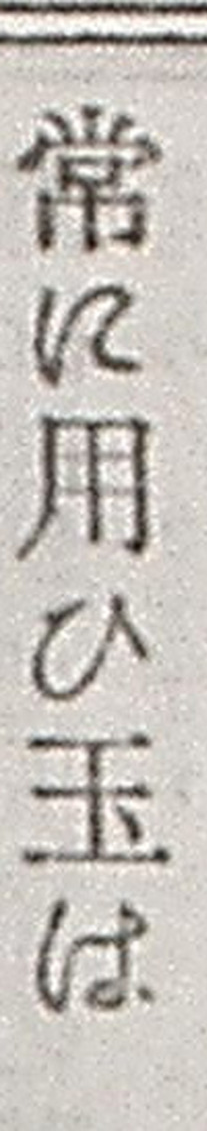常に用ひ玉は
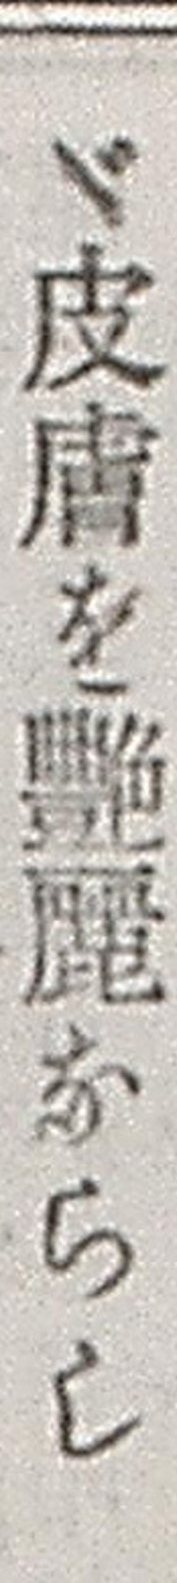ゞ皮膚を艶麗ならし
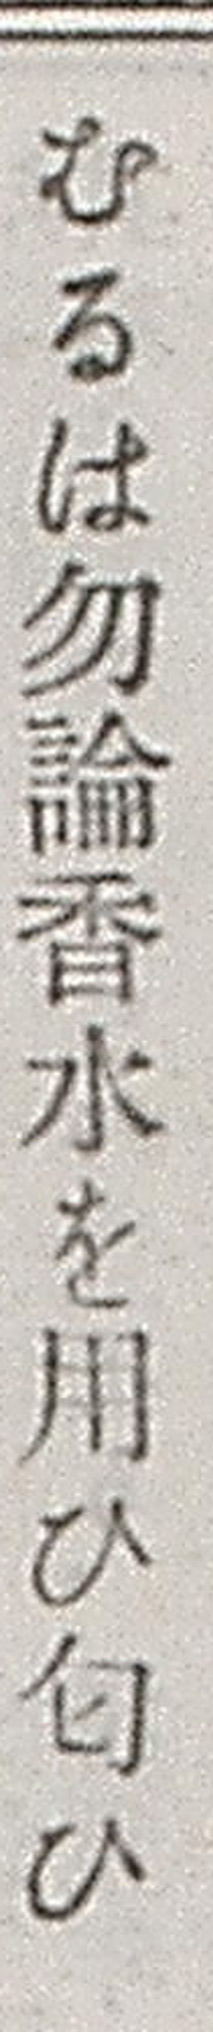むるは勿論香水を用ひ匂ひ
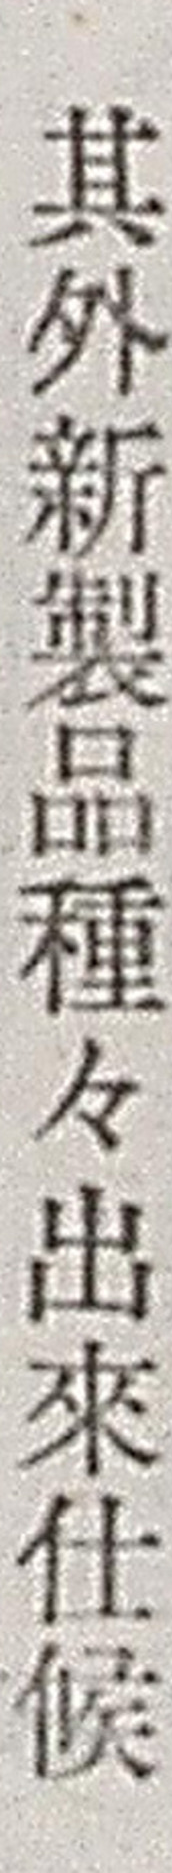其外新製品種々出来仕候
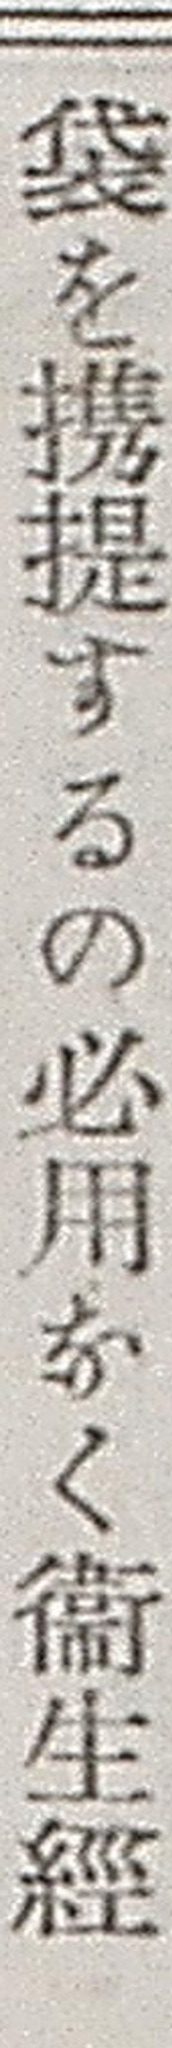袋を携提するの必要なく衛生経
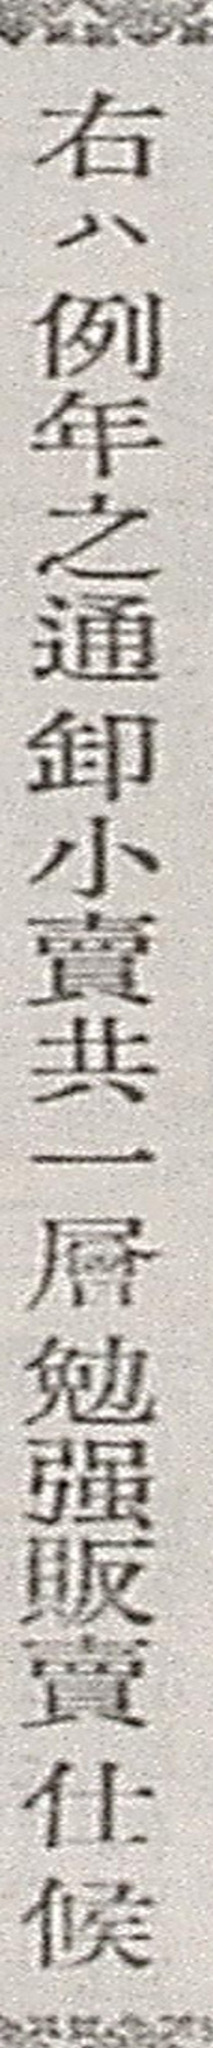右ハ例年之通卸小売共一層勉強販売仕候
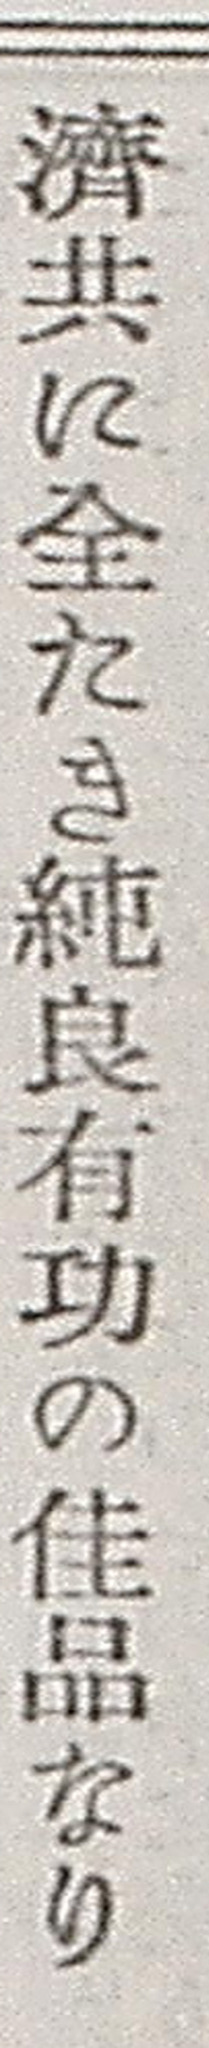済共に全たき純良有功の佳品なり
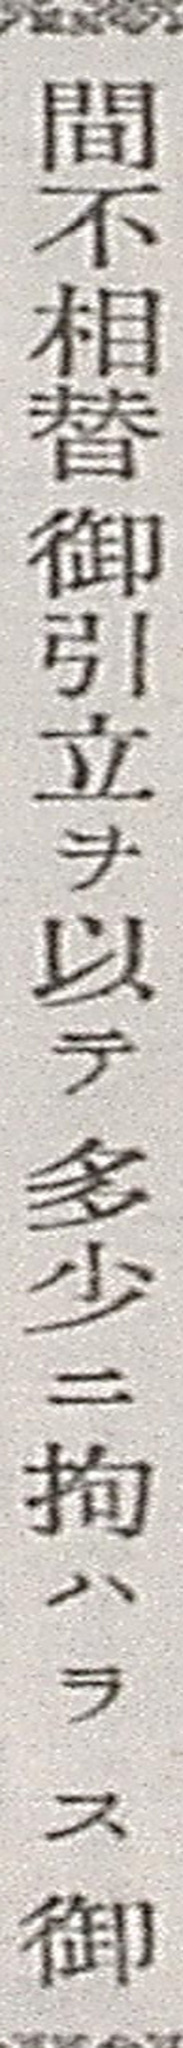間不相替御引立ヲ以テ多少ニ拘ハラス御
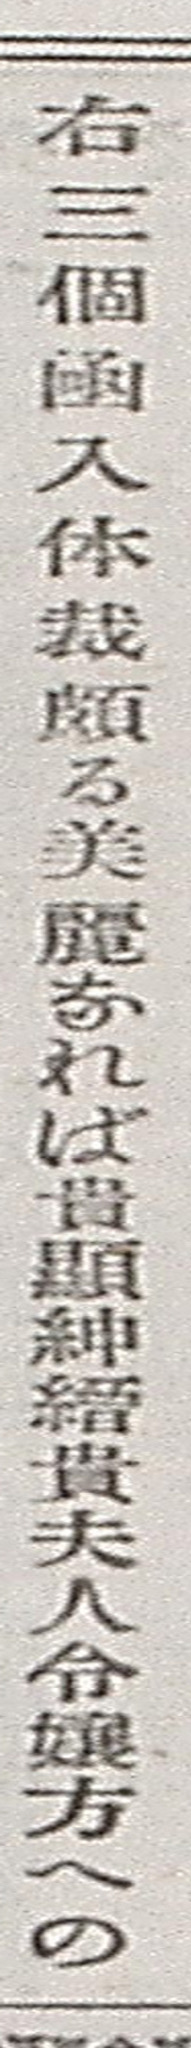右三個箱入体裁頗る美麗なれば貴顕縉紳貴夫人令嬢方への
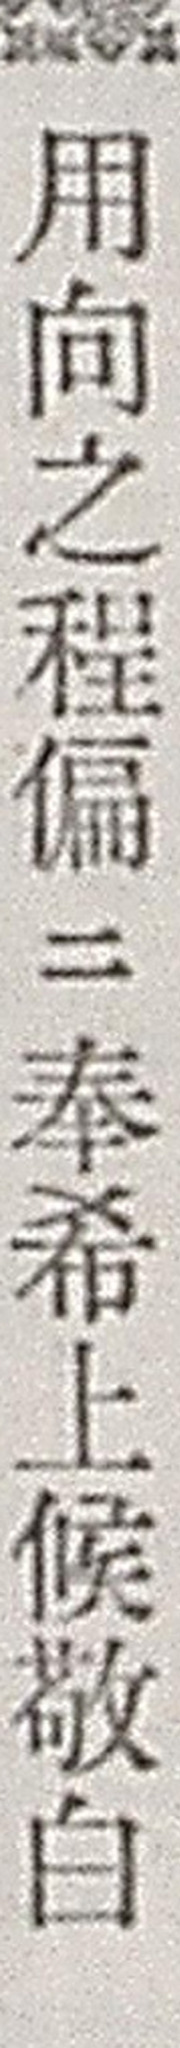用向之程偏ニ奉希上候敬白
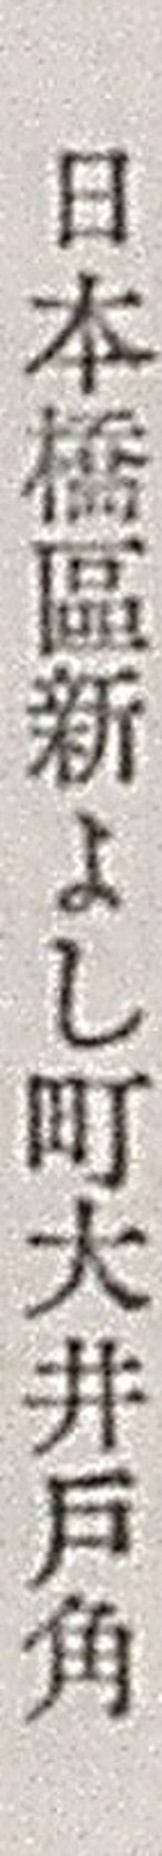日本橋区新よし町大井戸角
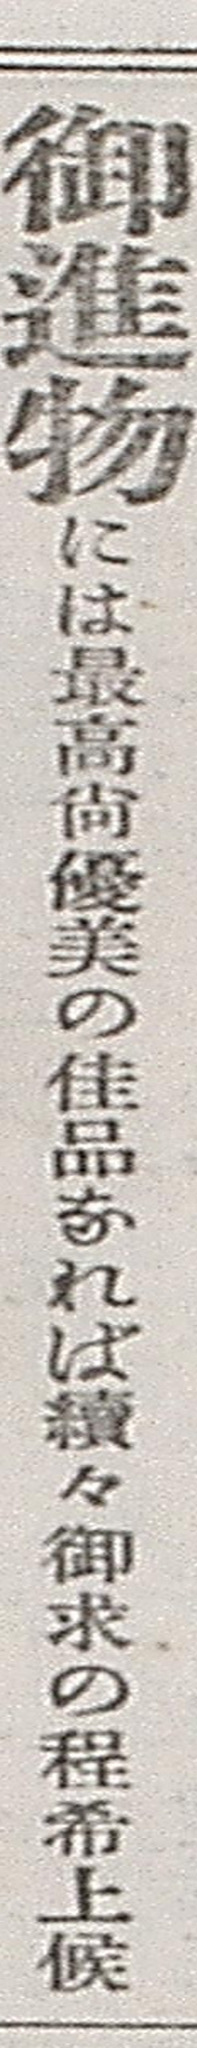御進物には最高尚優美の佳品なれば続々御求の程希上候
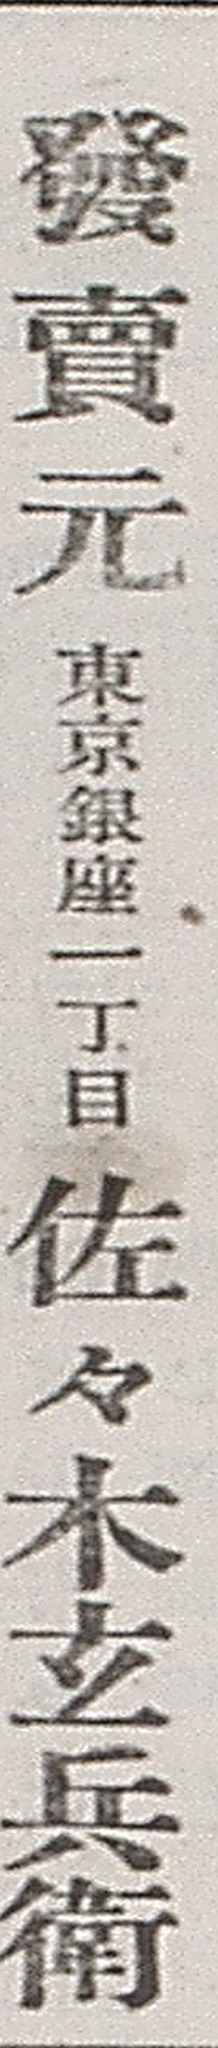発売元東京銀座一丁目佐々木玄兵衛
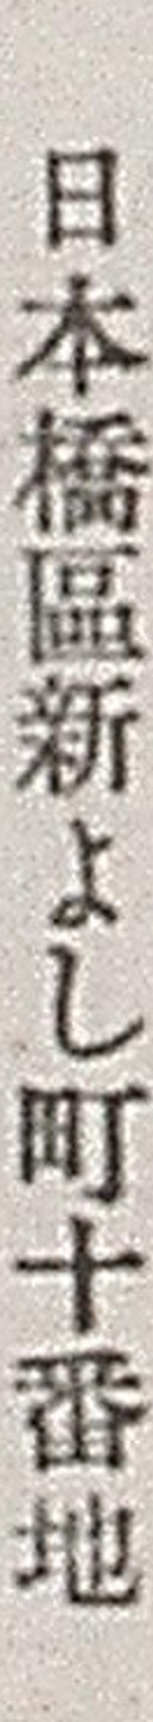日本橋区新よし町十番地
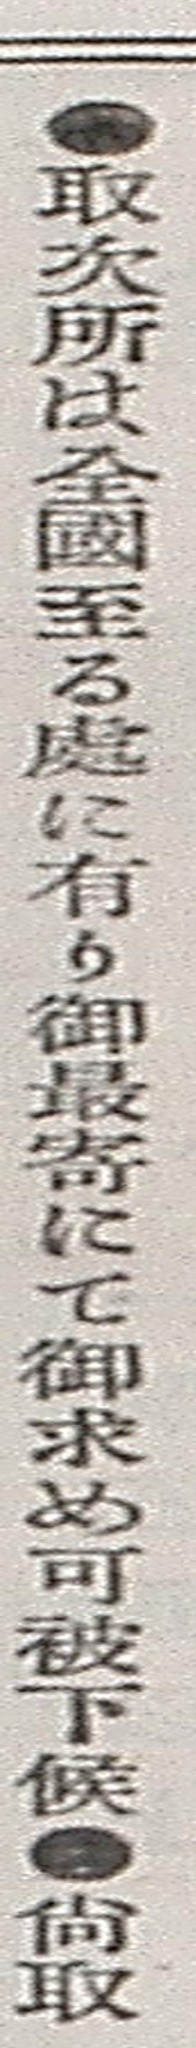●取次所は全国至る処に有り御最寄にて御求め可被下候●尚取
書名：風俗畫報臨時増刊第百二十號　大海嘯被害録（下）
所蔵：東京大学地震研究所図書室 Earthquake Research Institute Library, The University of Tokyo, JAPAN
